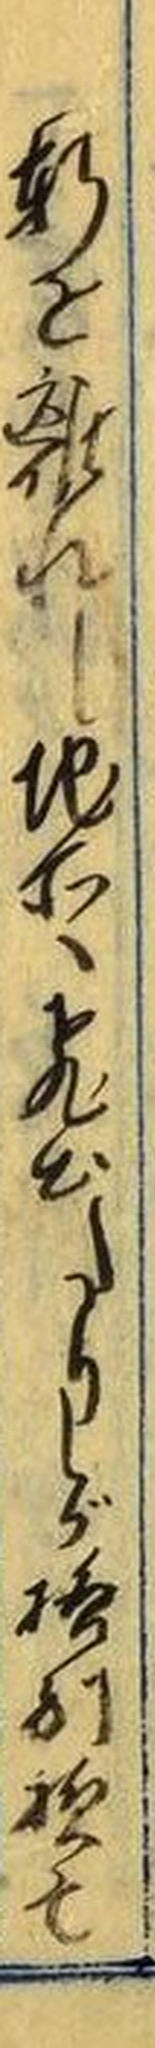軒を離れし地所へ飛出たりしが格別損亡

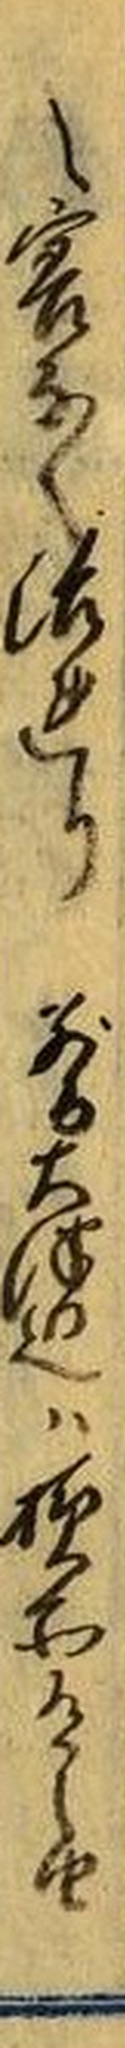之害なく治れり別而大津辺ハ損所有之由
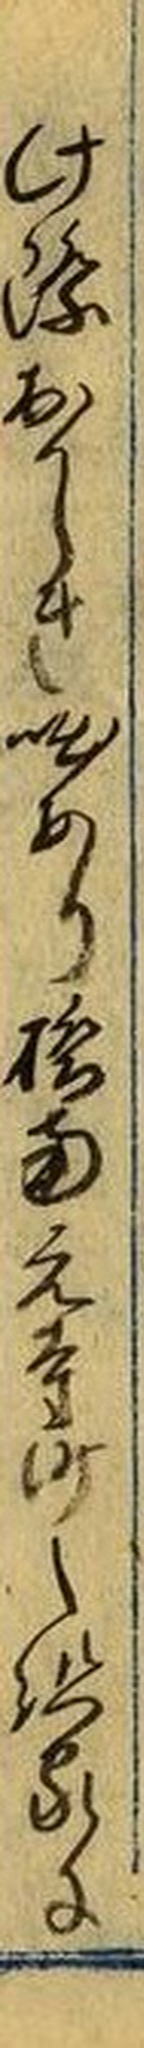此際おかしき咄あり橋南元寺町之役組家に
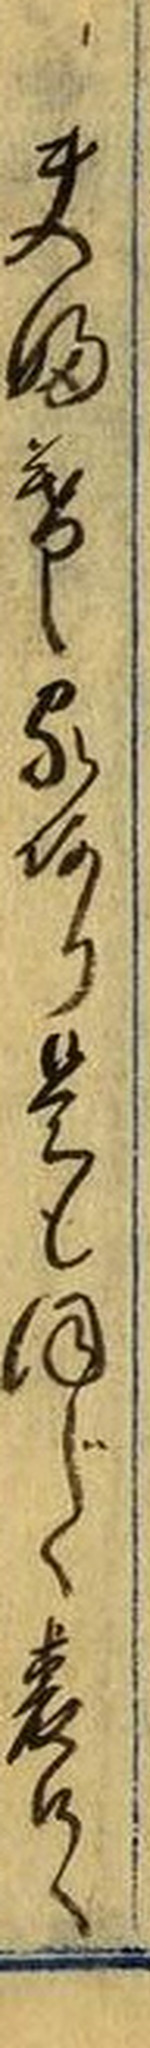夫婦暮之家あり是も同じく表口へ
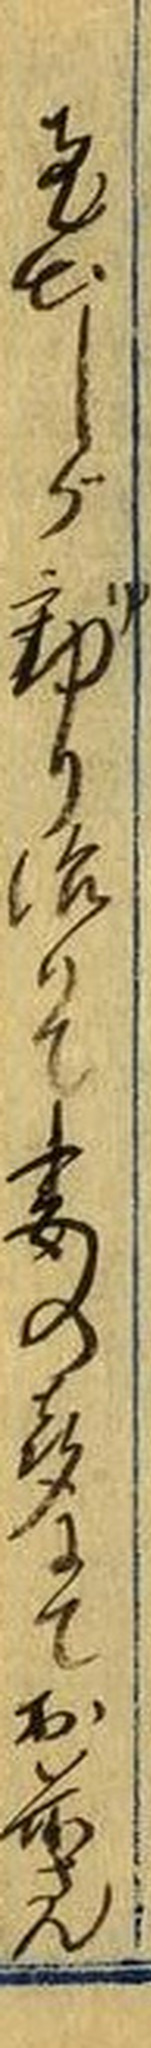飛出しが動り治りて妻の声にてお前さん
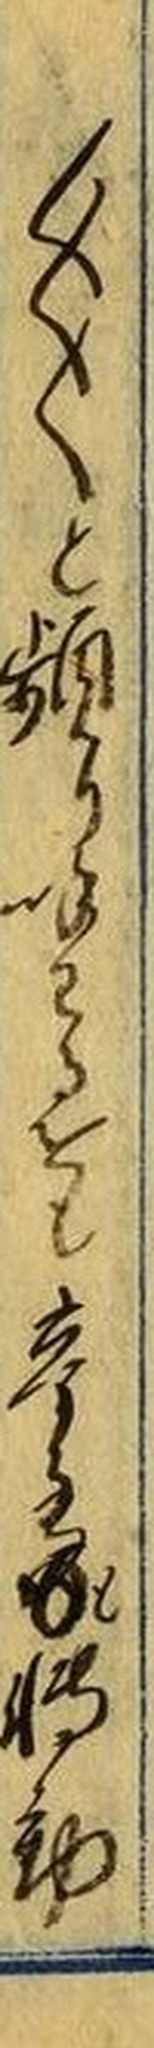〳〵〳〵〳〵と頻り呼わるをも亭主も転動
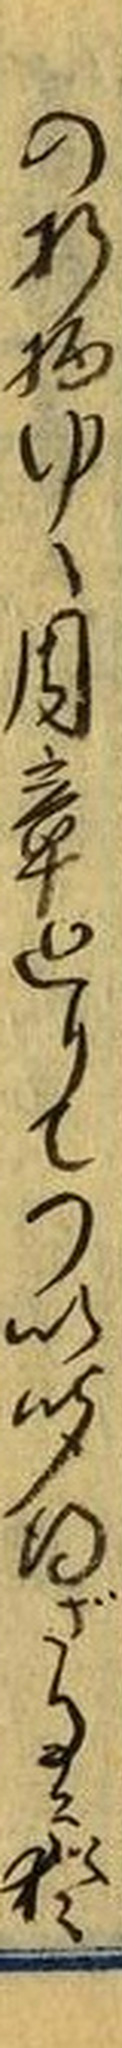の折柄ゆへ周章廻りてつい聞得ざるニ猶々
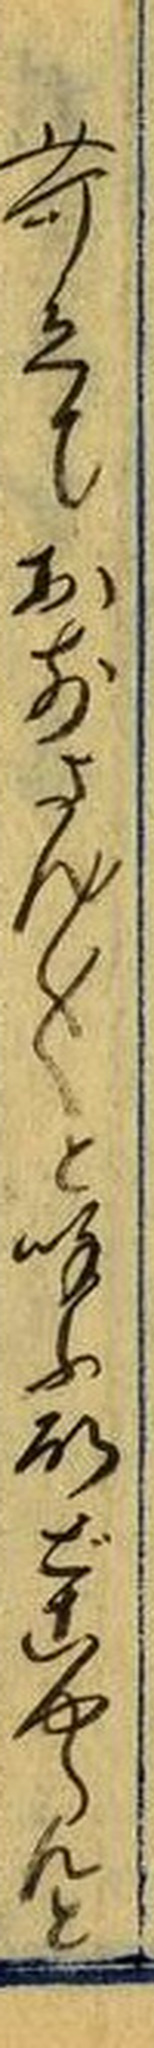苛立てお前さん〳〵〳〵と呼ふ故どこやらんと
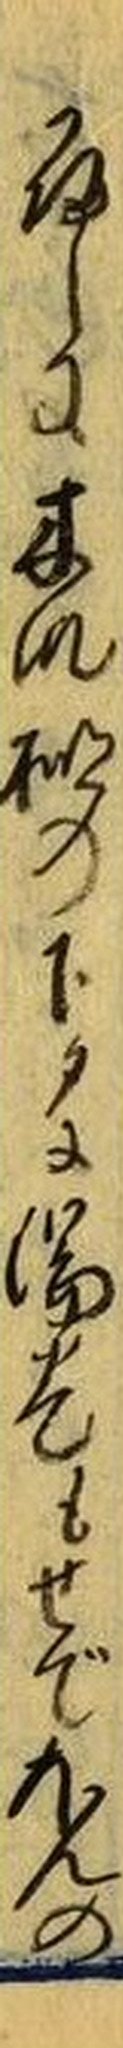尋しに木瓜棚の下タに湯巻もせでほんの
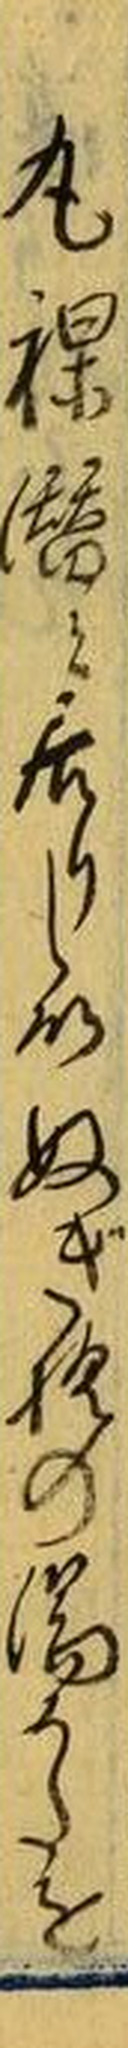丸裸潜ミ居りし故ぬぎ捨の湯かたを
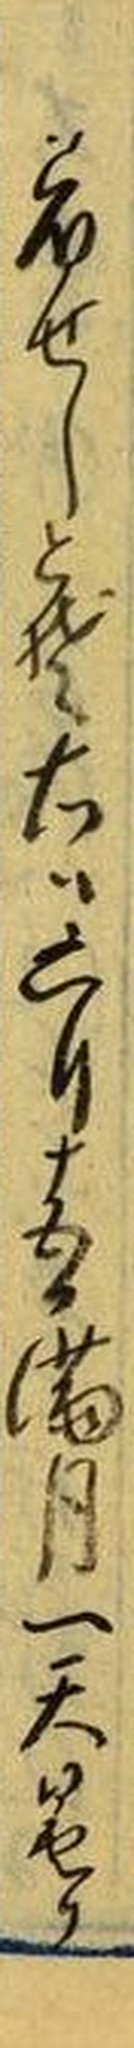着せしとそ右ハ六月十五日満月一天曇り
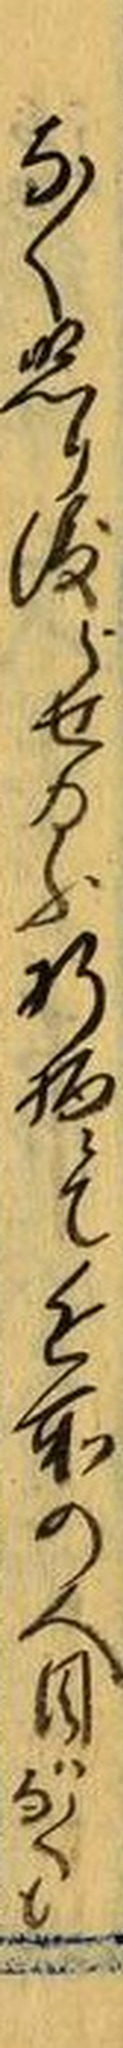なく照り渡らせ給ふ折柄ニて近所の人目ハなくも
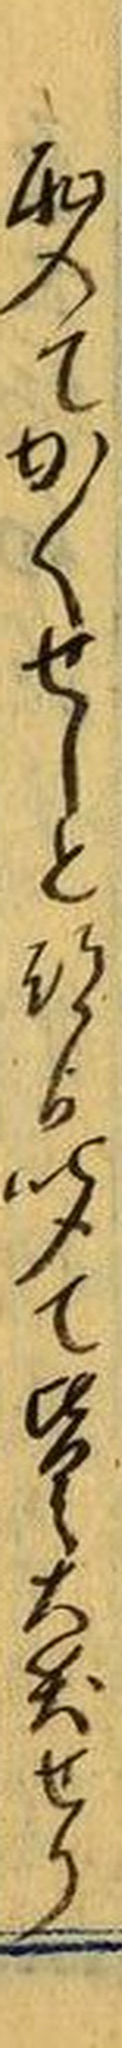恥入てかくせしと跡ゟ聞て皆々大笑せり
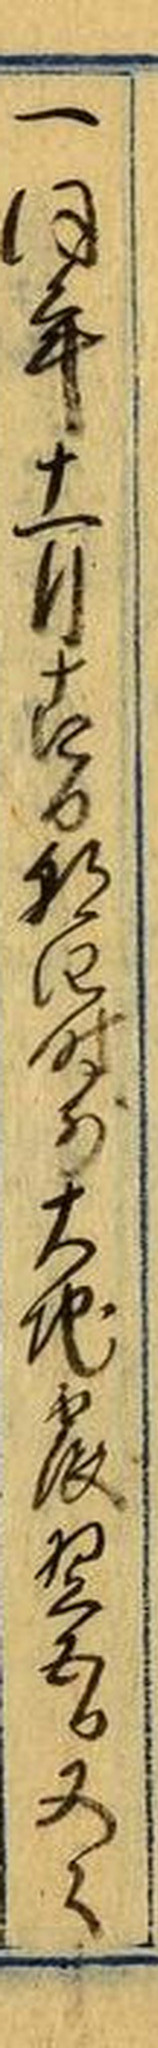一同年十一月十四日朝四時前大地震翌五日又々
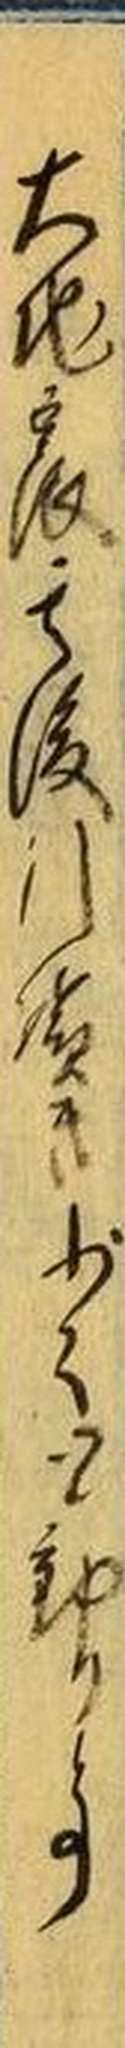大地震其後引続き少々ツゝ動り候事
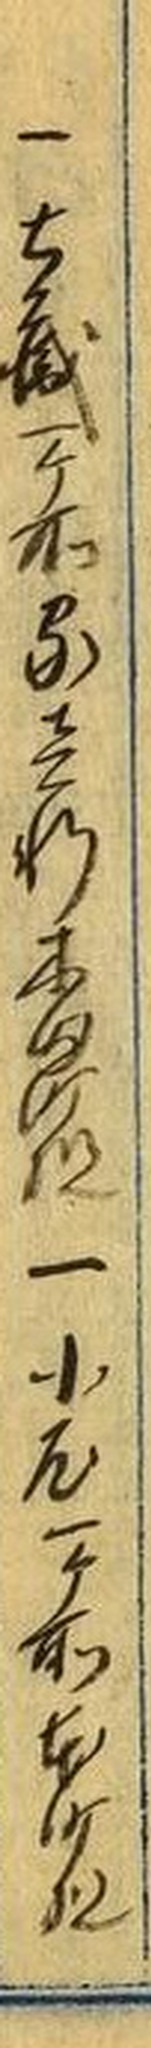一土蔵一ヶ所家壱軒本田町組一小屋一ヶ所本町組
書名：温古集 五巻
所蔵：福井県文書館 Fukui Prefectural Archives
